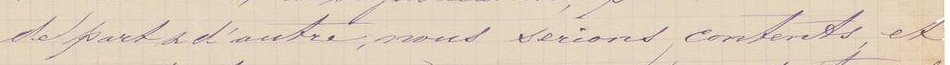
de part & d'autre, nous serions contents, et
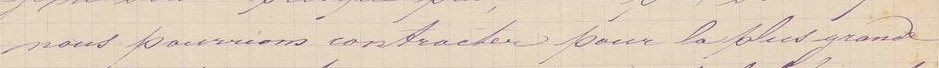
nous pourrions contracter pour la plus grande
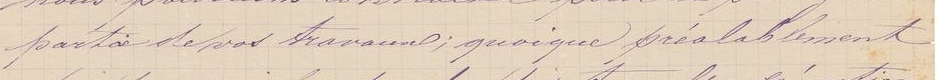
partie de vos travaux; quoique préalablement
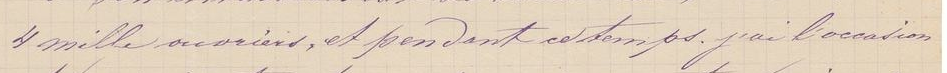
4 mille ouvriers, et pendant ce temps j'ai l'occasion
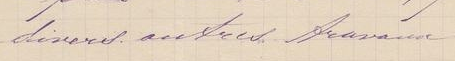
divers autres travaux.
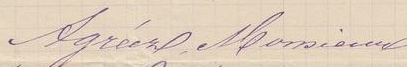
Agréez, Monsieur
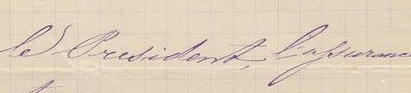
le President, l'assurance
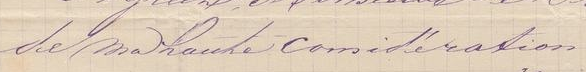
de ma haute considération
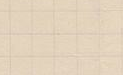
Ehrenfeld
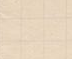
de
